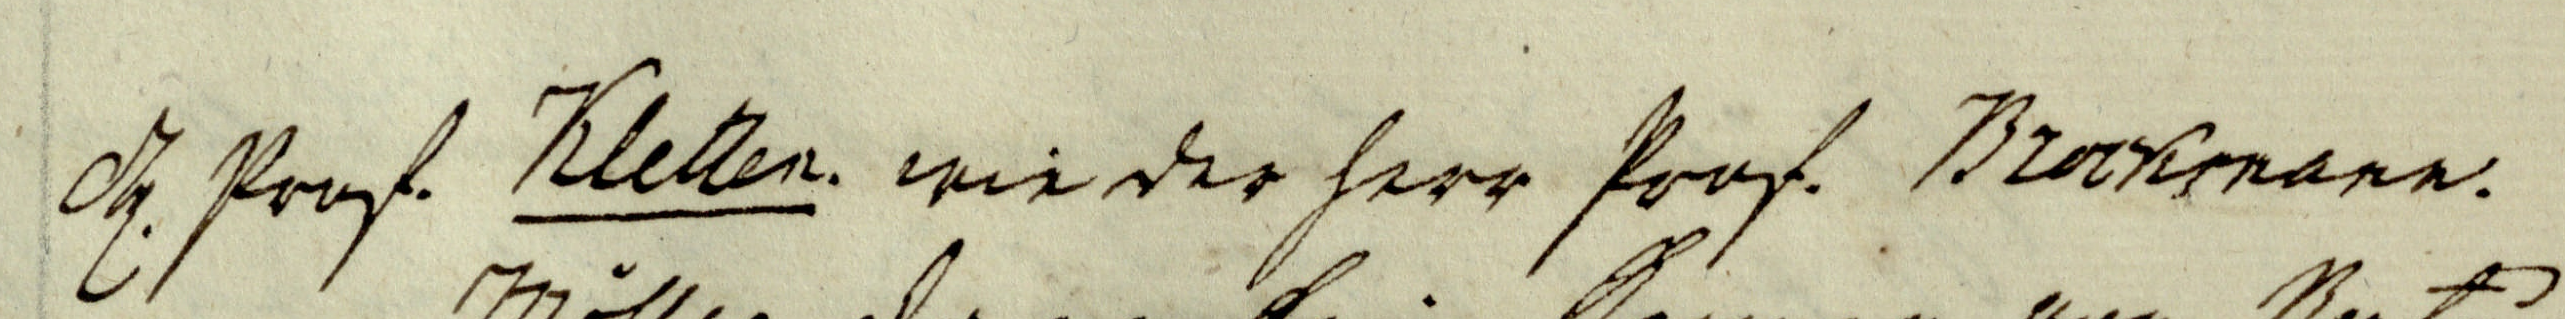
dh. Prof. Kletten. wie der Herr Prof. Brockmann.
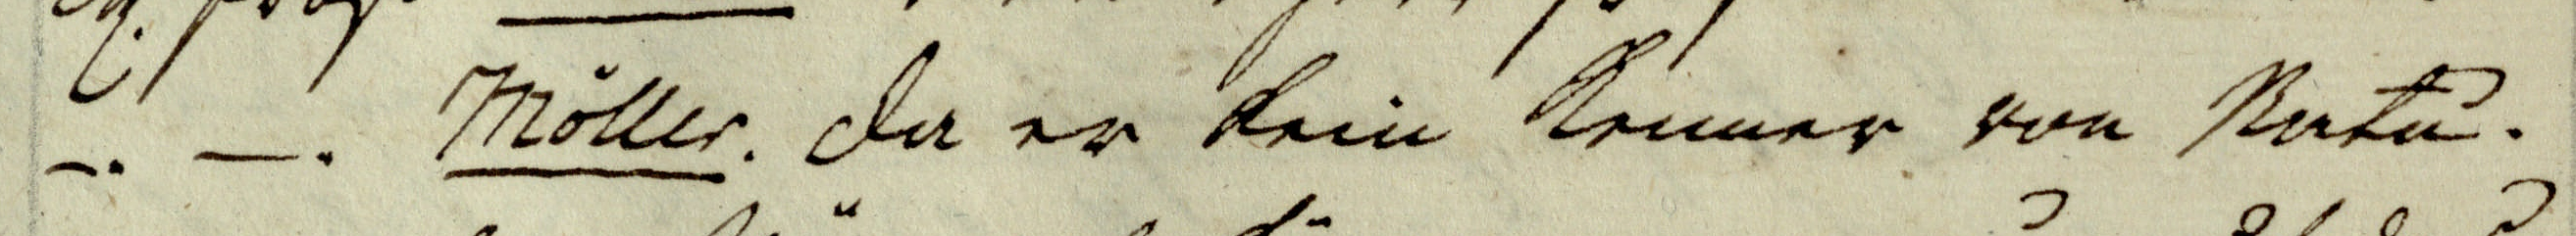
Möller. Da er kein Kenner von Natu¬
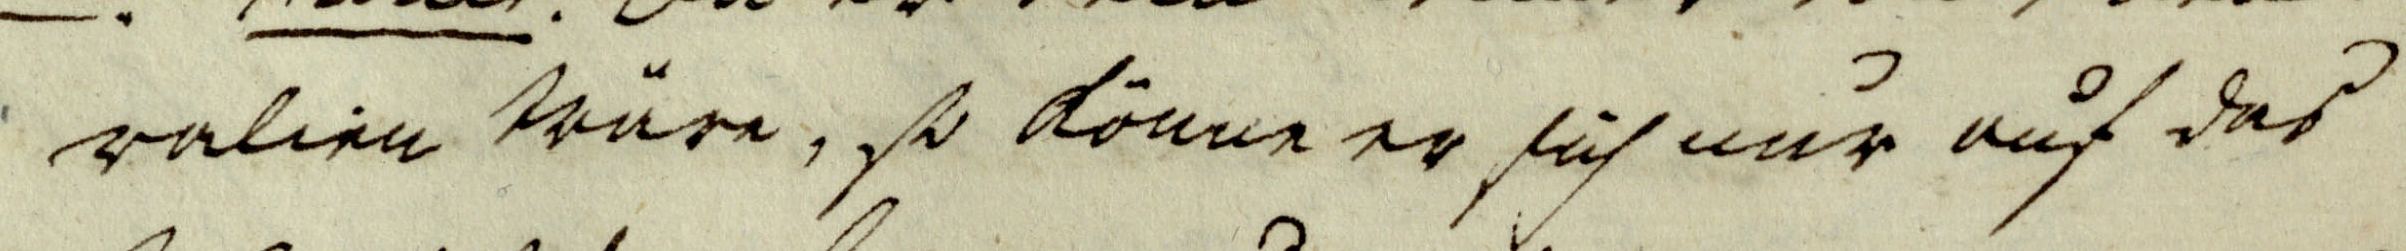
ralien wäre, so könne er sich nur auf das
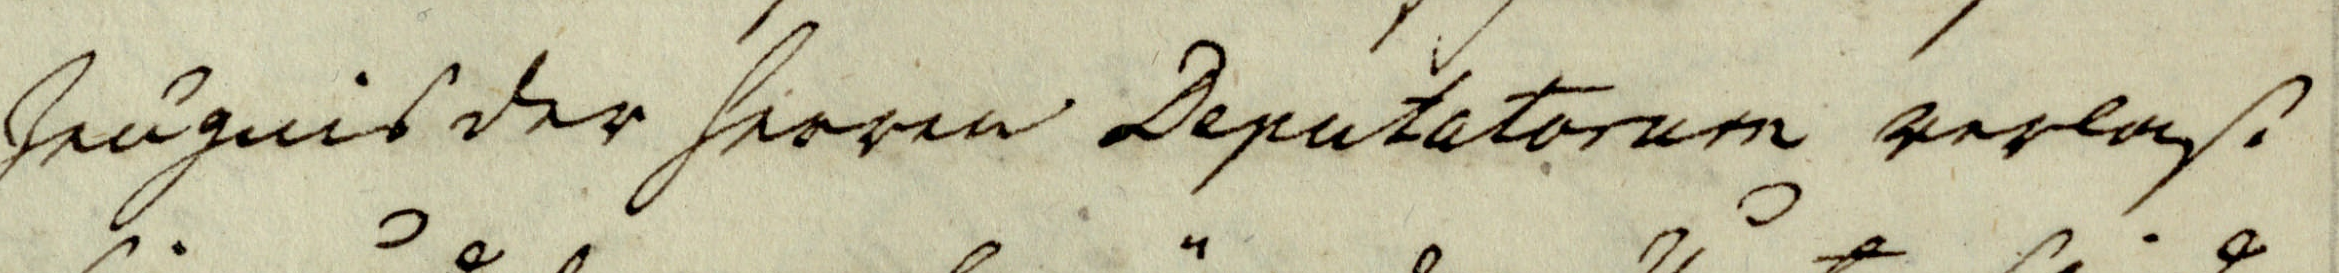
Zeugnis der Herren Deputatorum verlas¬
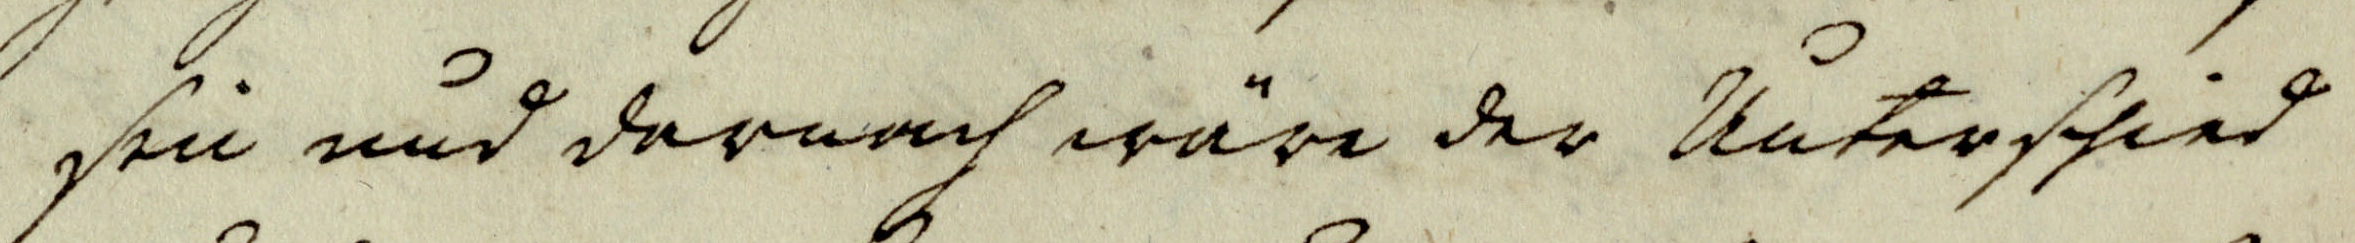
sen und darnach wäre der Unterschied
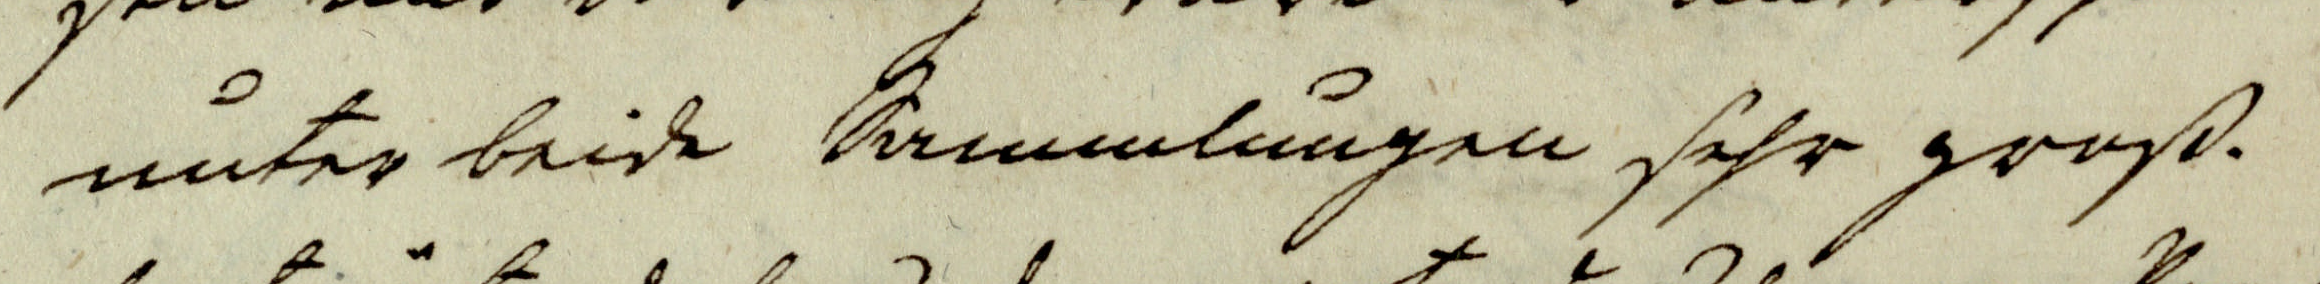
unter beide Sammlungen sehr groß.
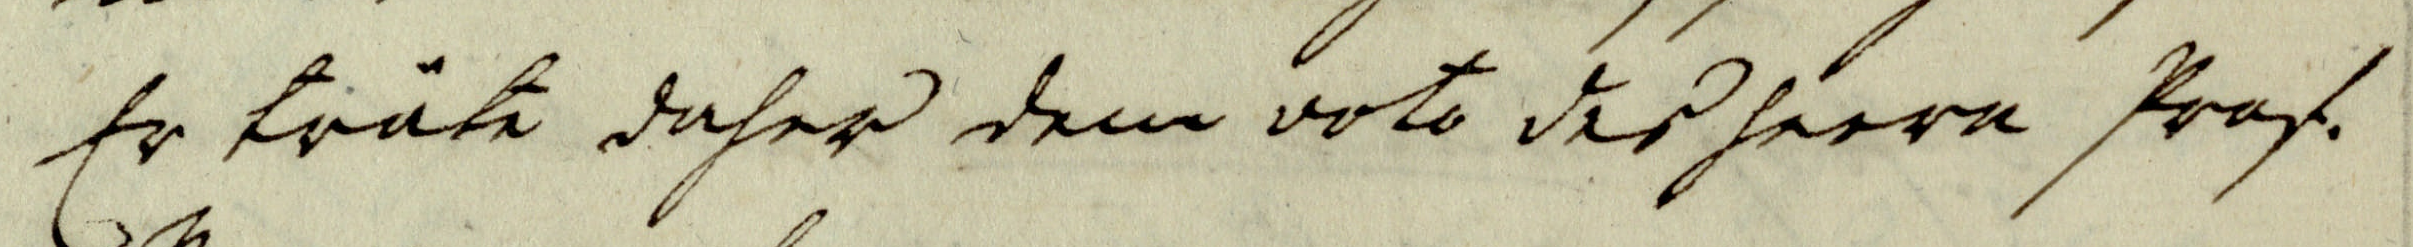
Er träte daher dem voto des Herrn Prof.
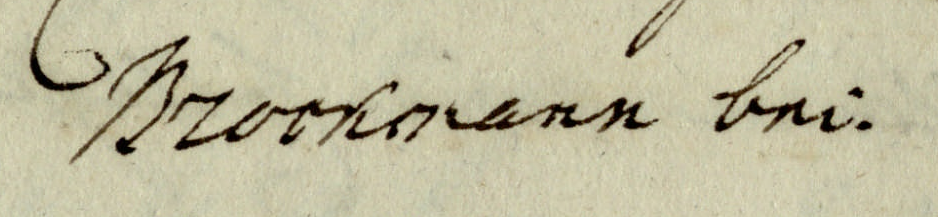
Brockmann bei.
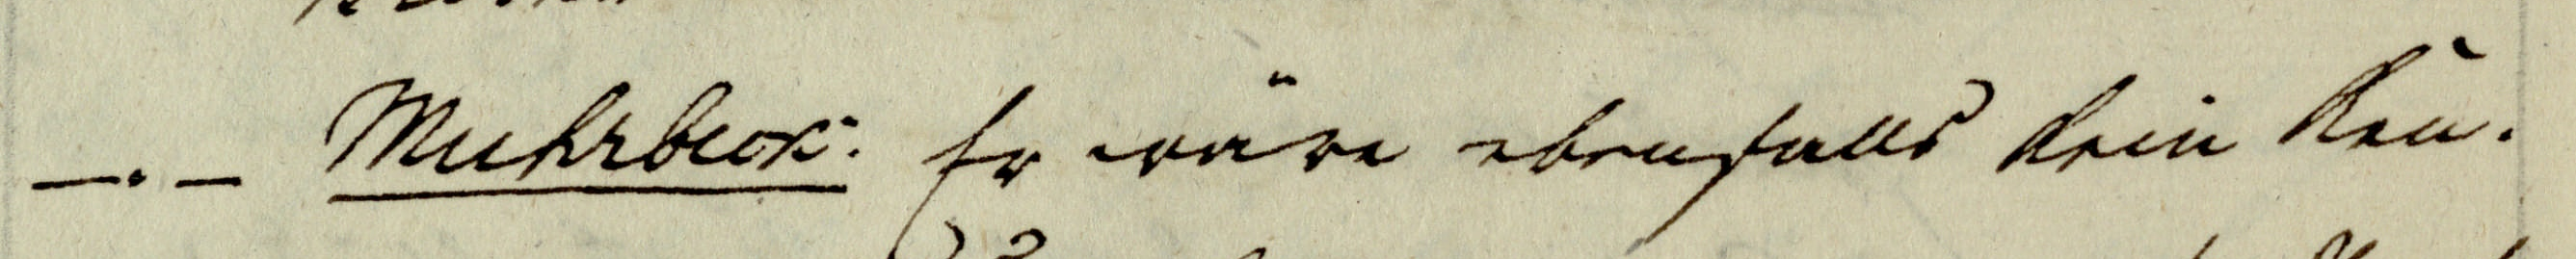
Muhrbeck. Er wäre ebenfalls kein Ken¬
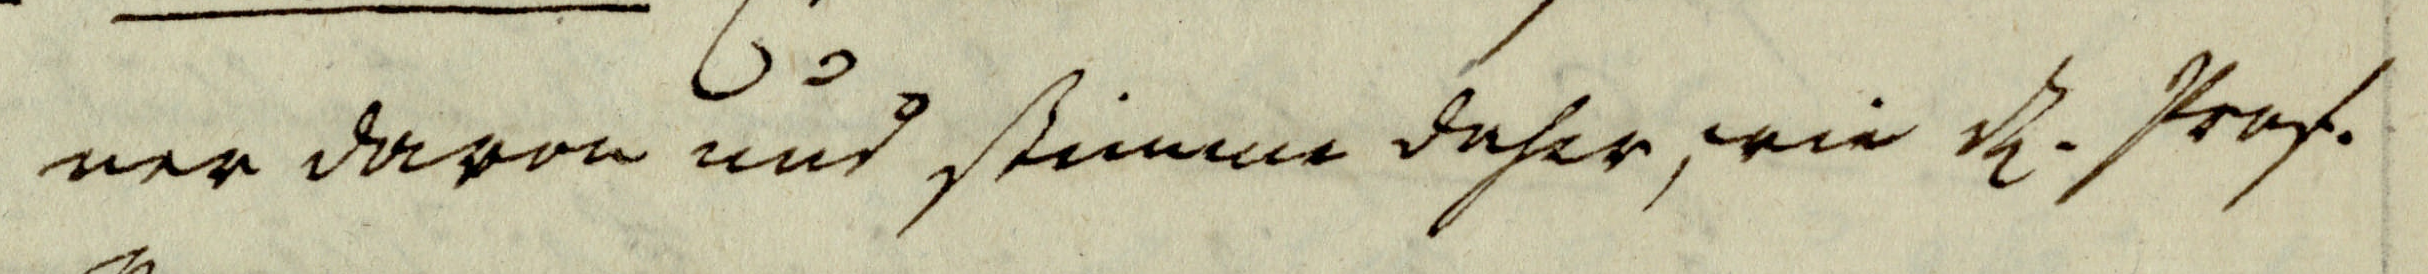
ner davon und stimme daher, wie dh. Prof.
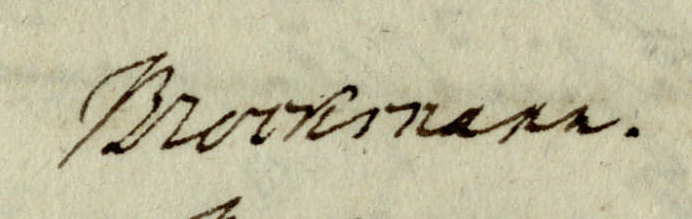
Brockmann.
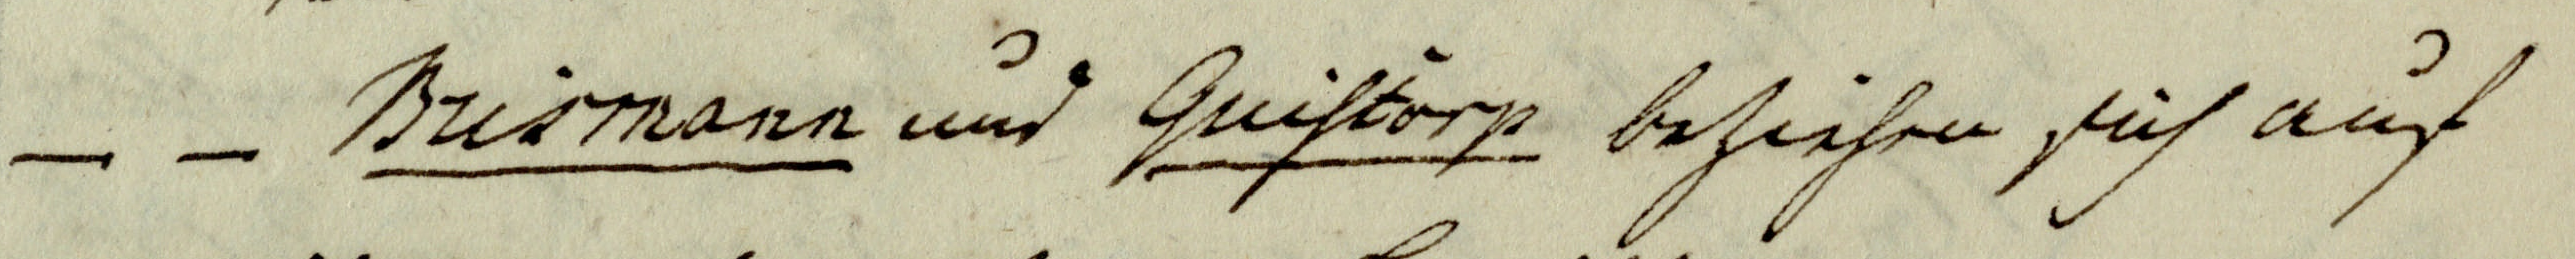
Brismann und Quistorp beziehen sich auf
